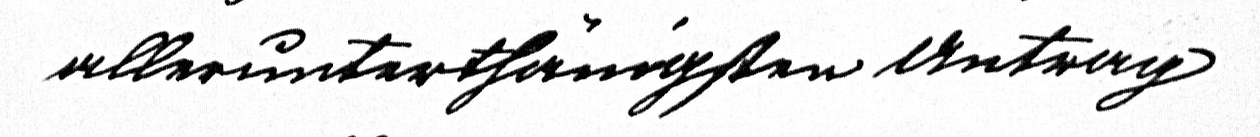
allerunterthänigsten Antrag
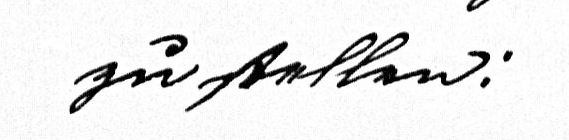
zu stellen:
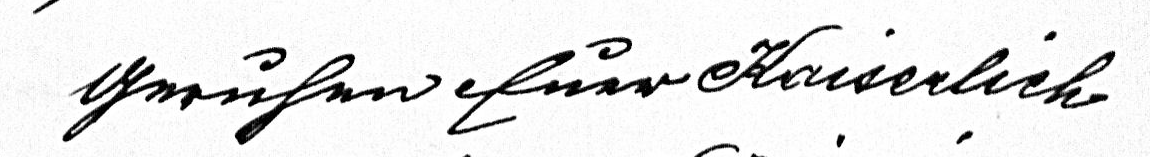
Geruhen Euer Kaiserlich
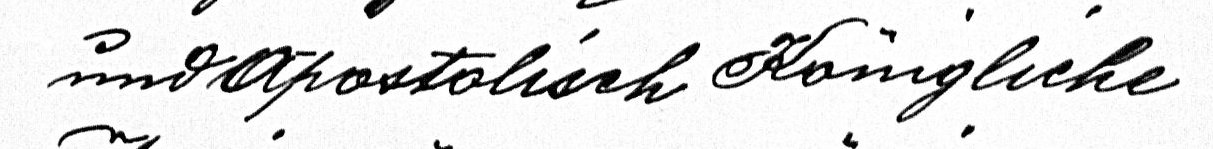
und Apostolisch Königliche
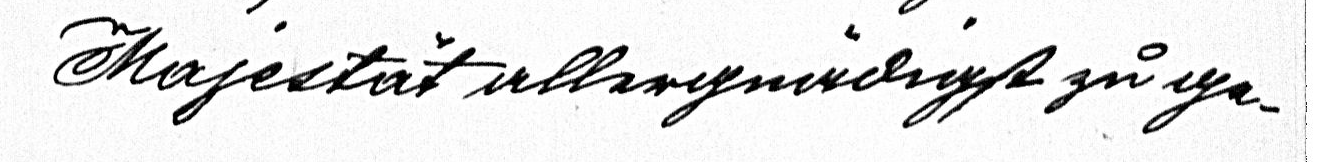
Majestät allergnädigst zu ge¬
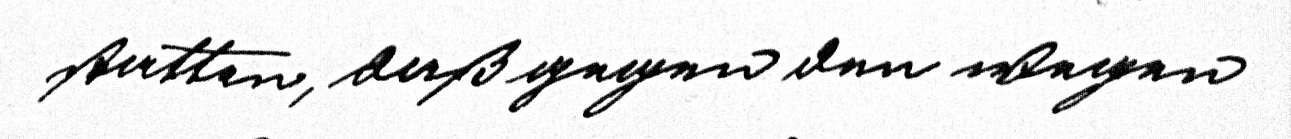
statten, daß gegen den wegen
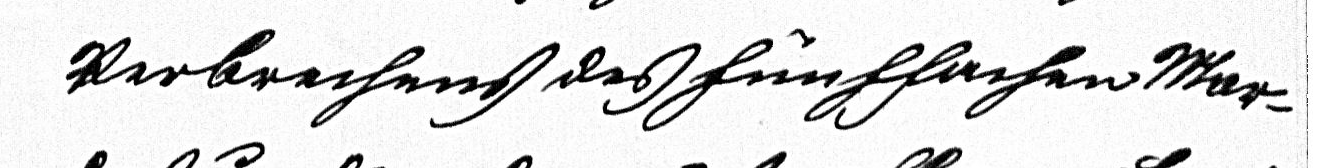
Verbrechens des fünffachen Mor¬
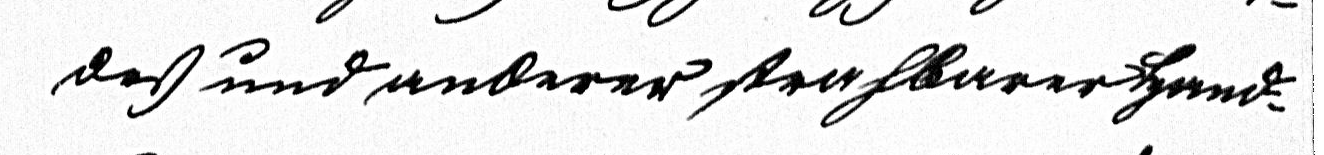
des und anderer strafbarer Hand¬
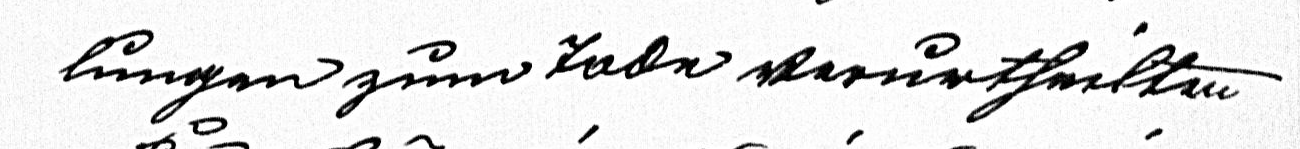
lungen zum Tode verurtheilten
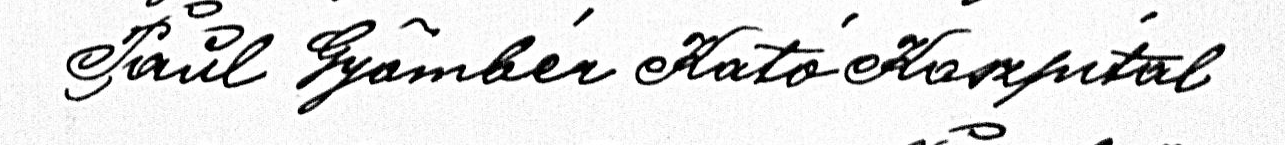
Paul Gyömbér Kató Koszspital
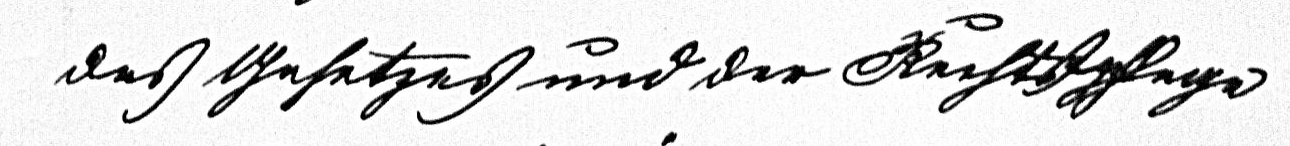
des Gesetzes und der Rechtspflege
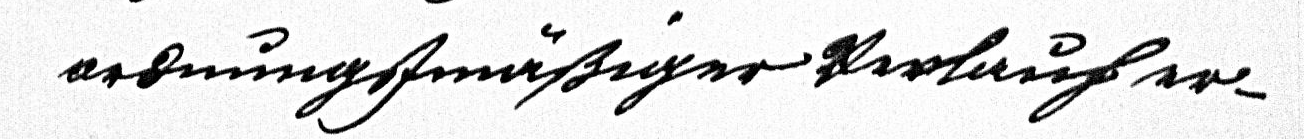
ordnungstmäßiger Verlauf er¬
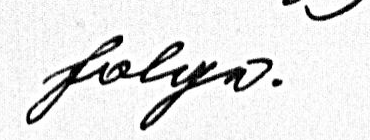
folge.
